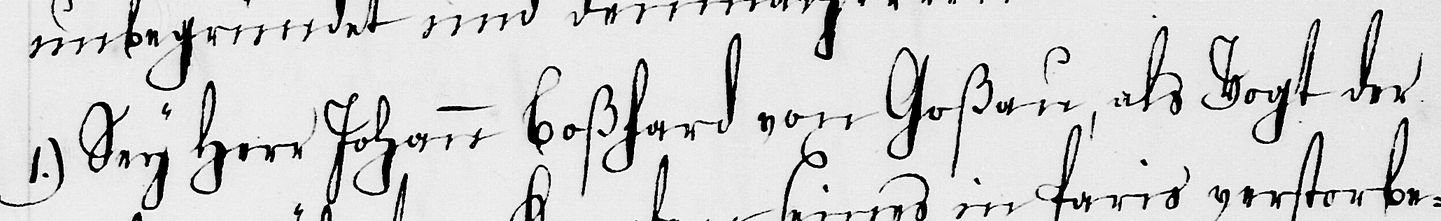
1.) Sey Herr Johann Boßhard von Goßau, als Vogt der
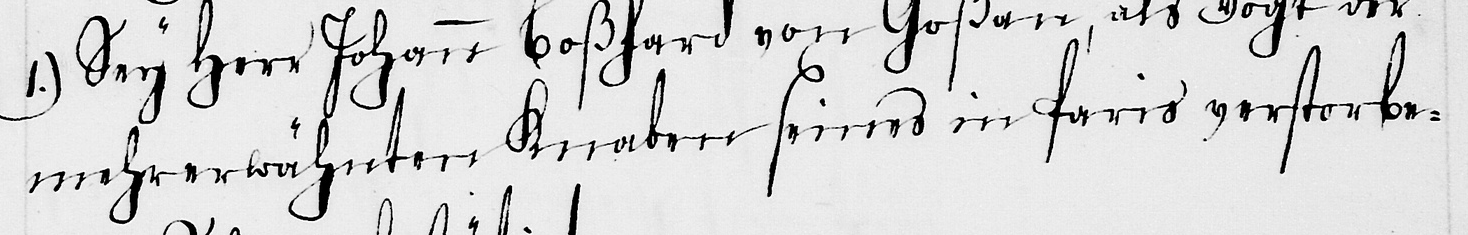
mehrerwähnten Knaben seines in Paris verstorbe¬
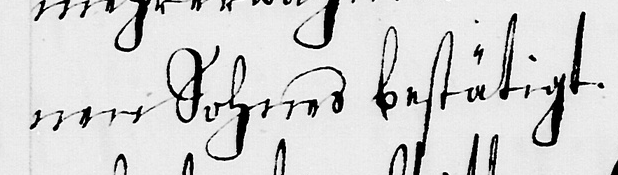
nen Sohnes bestätigt.
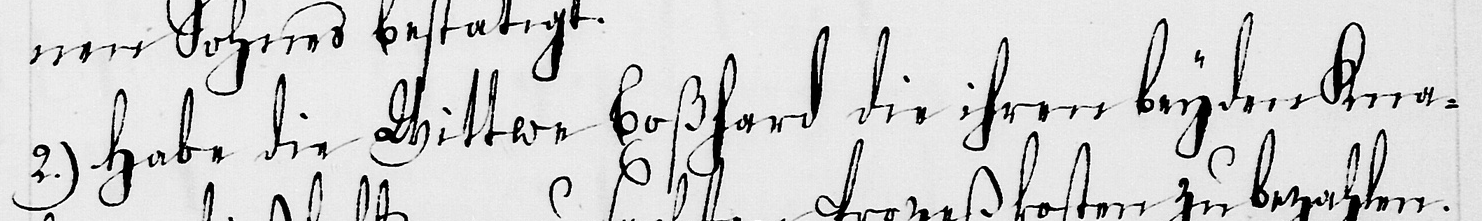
2.) Habe die Wittwe Boßhard die ihren beyden Kna¬
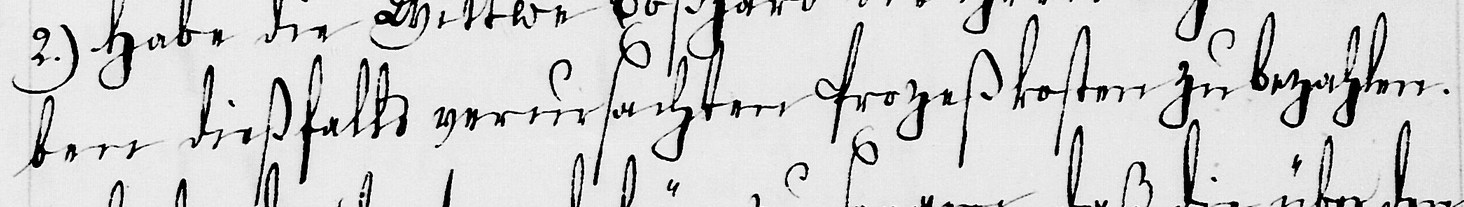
ben dießfalls verursachten Prozeßkosten zu bezahlen.
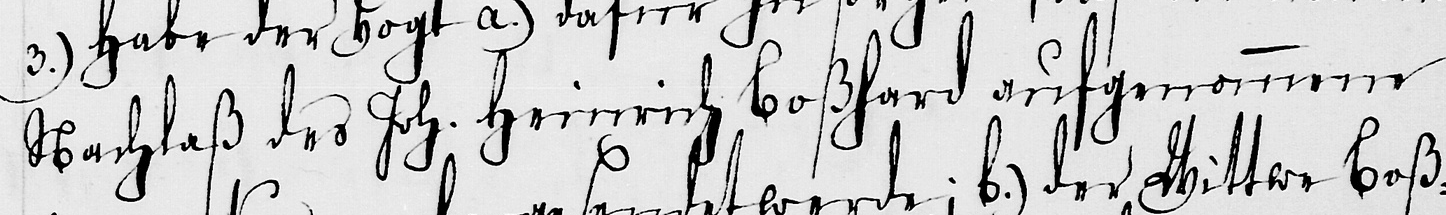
Nachlaß des Joh. Heinrich Boßhard aufgenommene
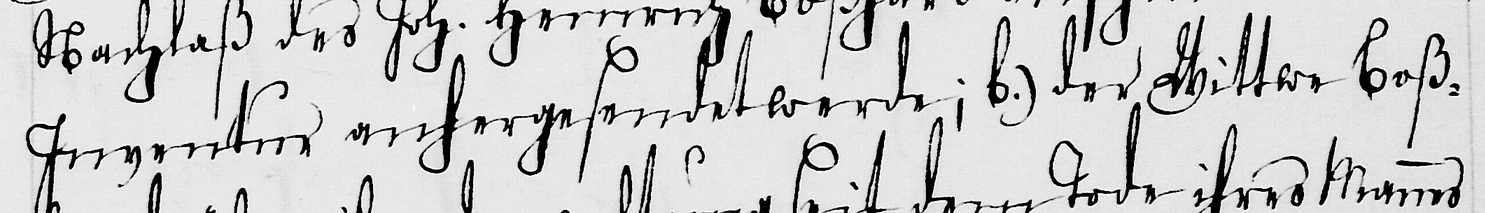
Inventur anhergesendet werde; b.) der Wittwe Boß¬
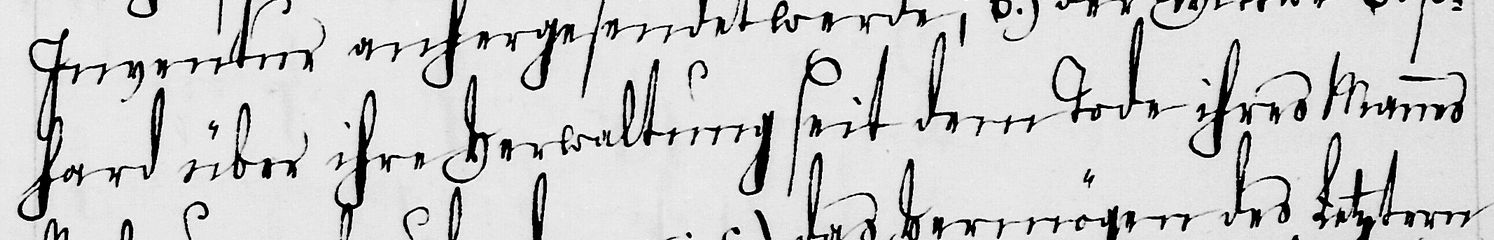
hard über ihre Verwaltung seit dem Tode ihres Mannes
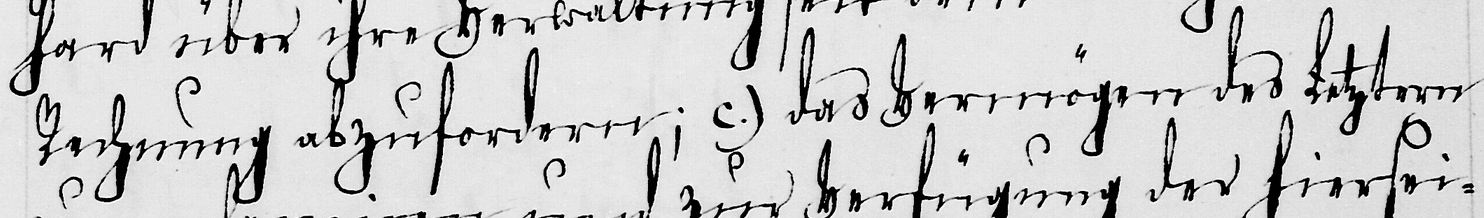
Rechnung abzufordern; c.) das Vermögen des Letztern
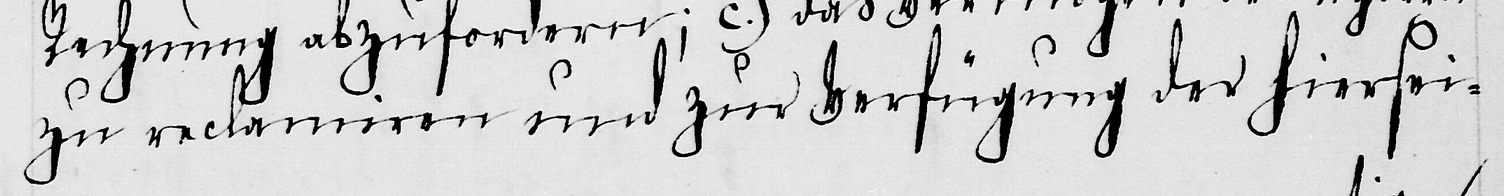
zu reclamiren und zur Verfügung der hiersei-
